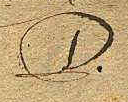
D.
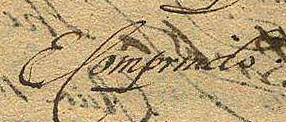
E Comprindo
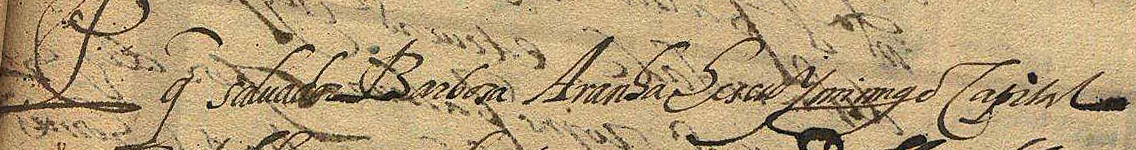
P q̄ saluador Barbosa Aranha he seu Ynimigo Capital
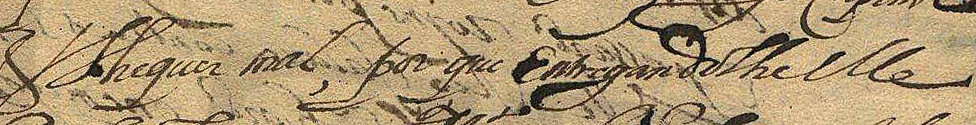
& lhe quer mal, porque Entregandolhe elle
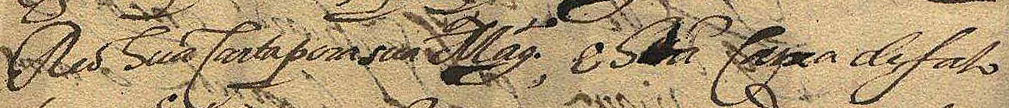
Reo huā Carta pera sua Mag.te, e huā Caixa de fato
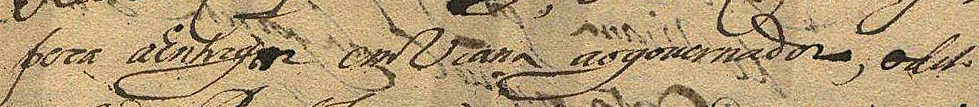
pera a Entregar em Viana ao gouernador, o dito
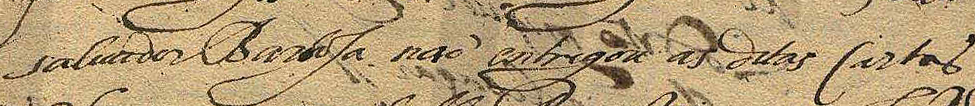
saluador Barbosa naõ entregou as ditas Cartas
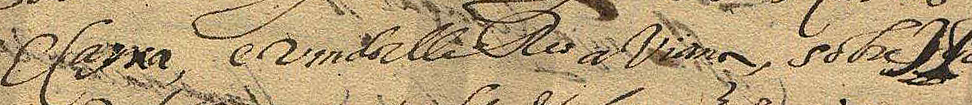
E Cayxa, e vindo elle Reo a Viana, sobre Jso
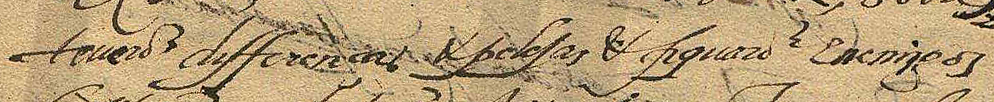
teuerō differenças & pelejas & fiquarō Enemjgos
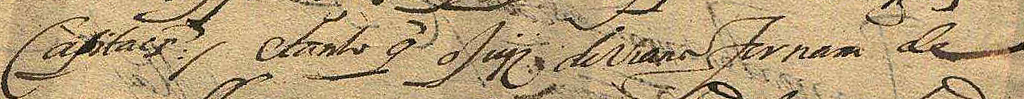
Capitaes. / e tanto q̄ o Jujz de viana fernam de
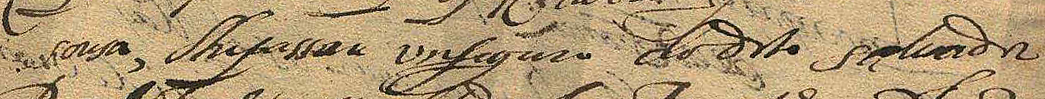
sousa, lhe passou vn seguro do dito saluador
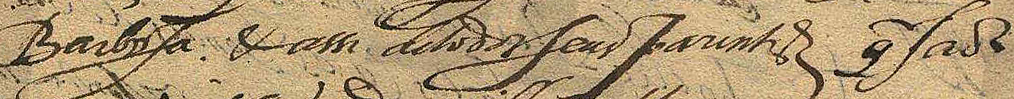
Barbosa. & assi de todos seus parentes q̄ saõ
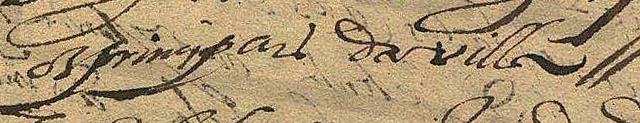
os princjpais da villa //
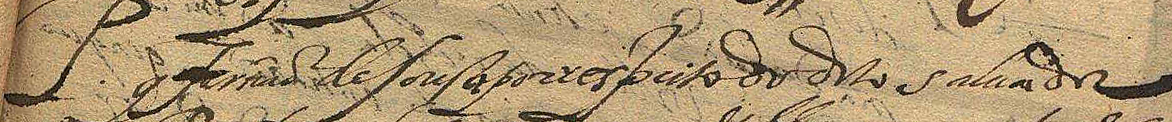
P. q̄ fernaõ de sousa por respeito do dito saluador
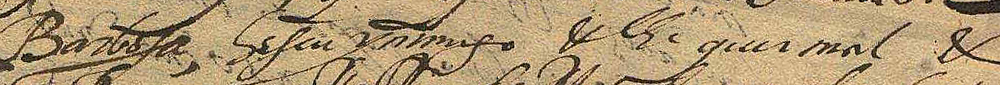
Barbosa, he seu Ynimigo & lhe quer mal &
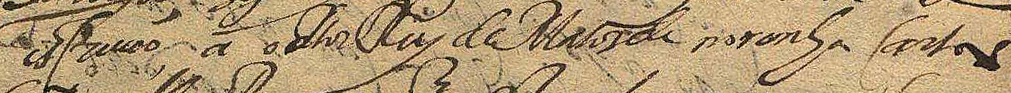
esCriueo a o dtor Ruj de Matos de noronha Cartas
